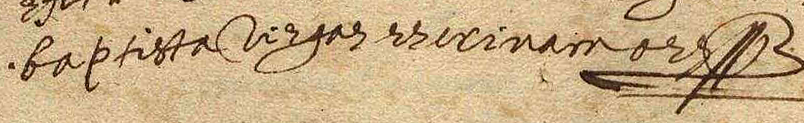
baptista viEgas Escriuam o Estp̄
